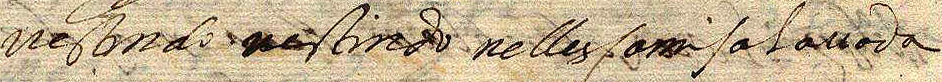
uestindo uestindo nelles Camisa lauada
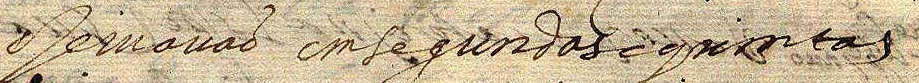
e Jeiuauaõ em segundas e quintas
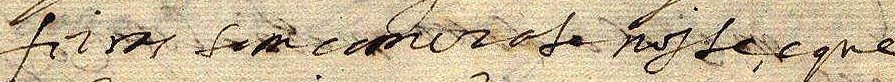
feiras sem comer ate nojte, e que
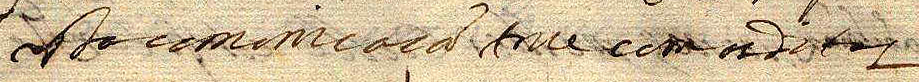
esta comonicaçaõ teue com as ditas
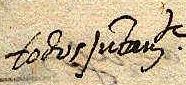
todos Jūtamte.
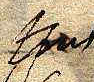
tpus
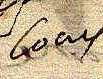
locus
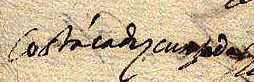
Costāca diz cunhada
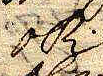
o R.
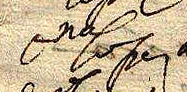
cna lopez auô
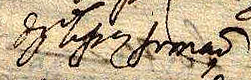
dyo lopez Jrmaõ
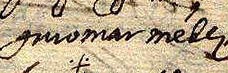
guiomar mēdez
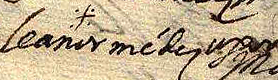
leanor mēdez uxor
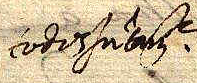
todos Jūtamte.
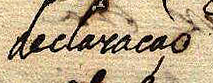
declaraçaõ
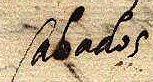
sabados
